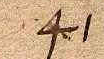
41
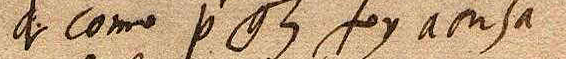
de como po gz̄ foy acusa
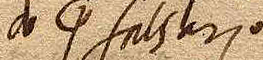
do p̄o falsarjo
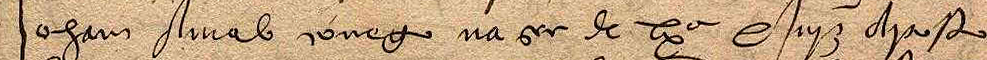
Joham Amado conego na see de lxa e Juiz Aposto
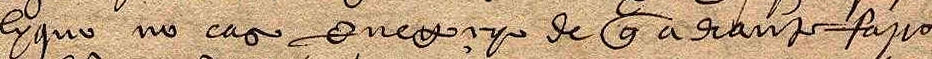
lyquo no caso E negocyo de q̄ adiante fazia
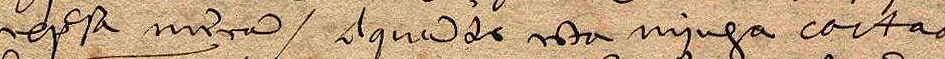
exp̄sa mēçā / A quātos esta mjnha cartaa
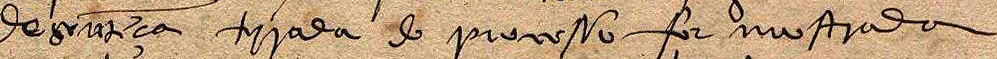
de sentēça tyrada do processo for mostrada
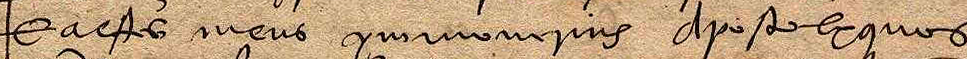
E a estes meus ymmouerius Apostolyquos
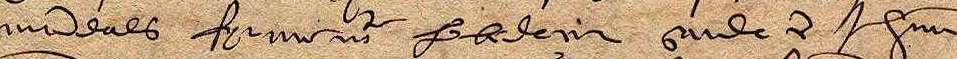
mādados fyrmemte hobedecer saude ē Jhūu
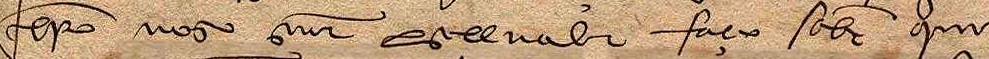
x̄po noso sn̄or e salluador faço sab̄r que
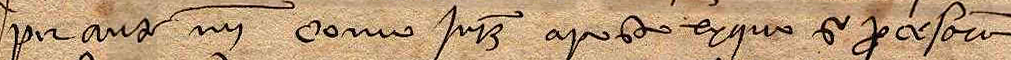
perante m̄j como Juiz apostolyquo se ꝓcesarā
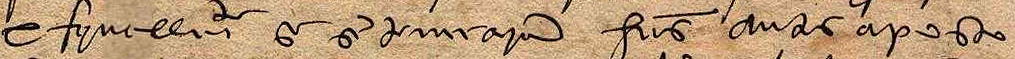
e fynallmte se sētencearā hus̄ autos aposto
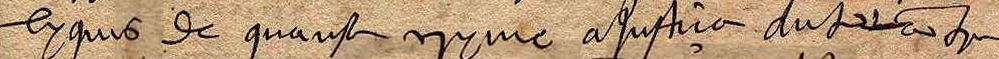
lyquos de quausa cryme a Justiça Autor cōtra
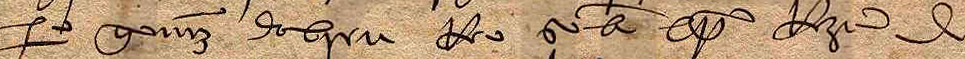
ꝑo gomez dabreu Reo sob̄r e p̄o Rezā de
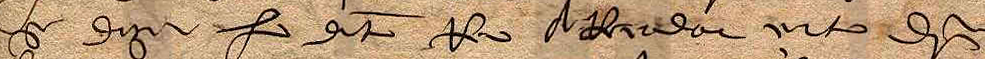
se dizer ho dito Reo ARecadar certo drro
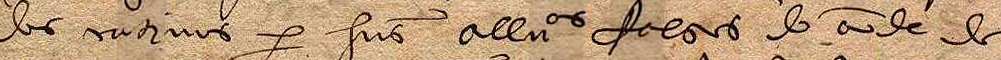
dos catiuos ꝑ hūs alluas falsos do c̄ode de
